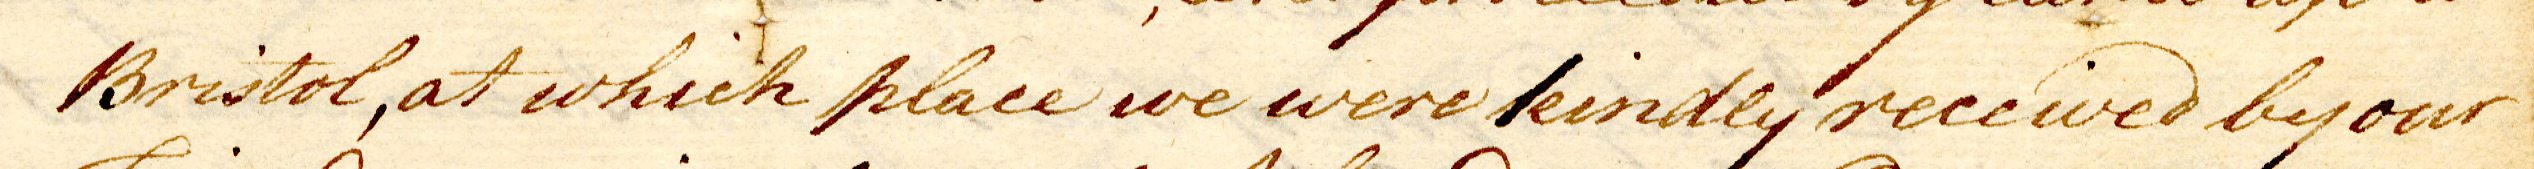Bristol, at which place we were kindly received by our
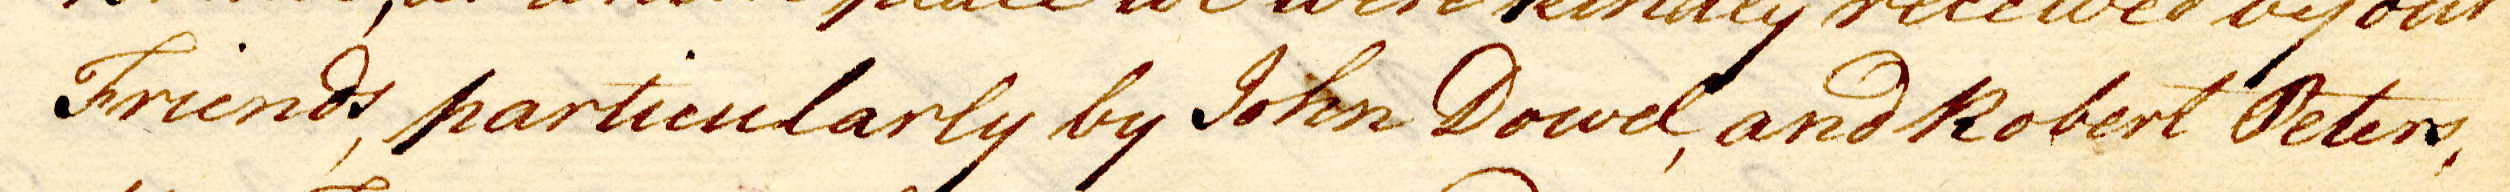Friends, particularly by John Dowel, and Robert Peters,
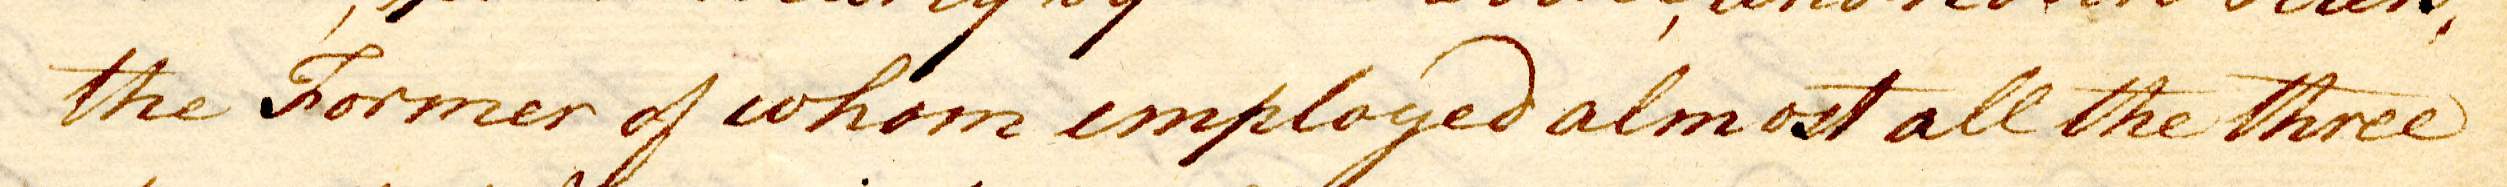the Former of whom employed almost all the three
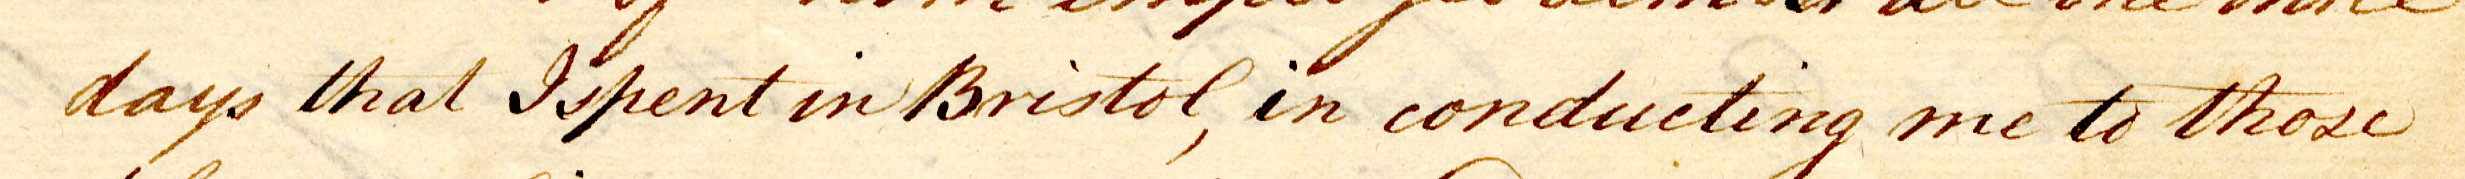days that I spent in Bristol, in conducting me to those
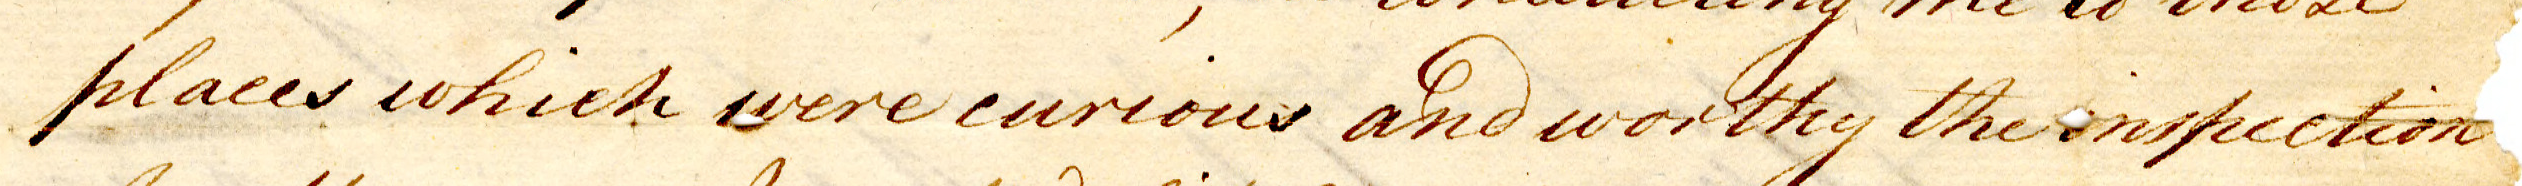places which were curious and worthy the inspection
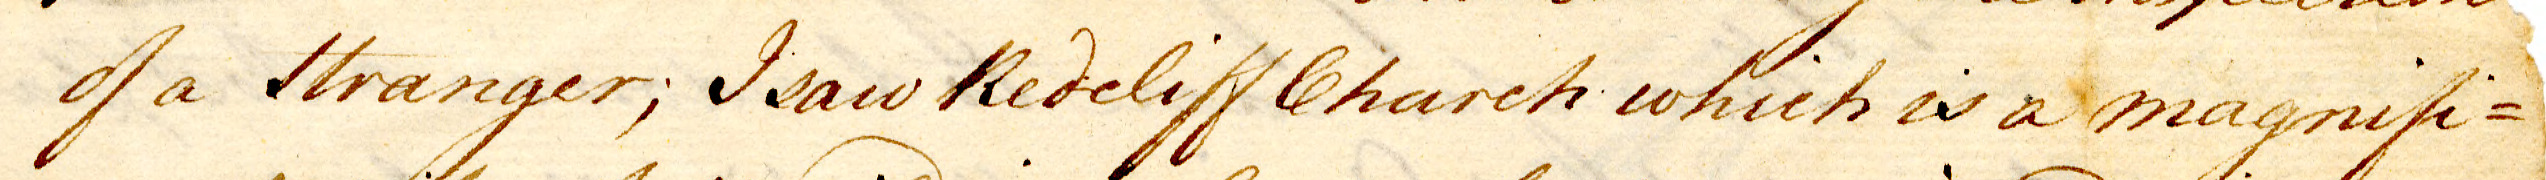of a stranger; I saw Redcliff Church which is a magnifi-
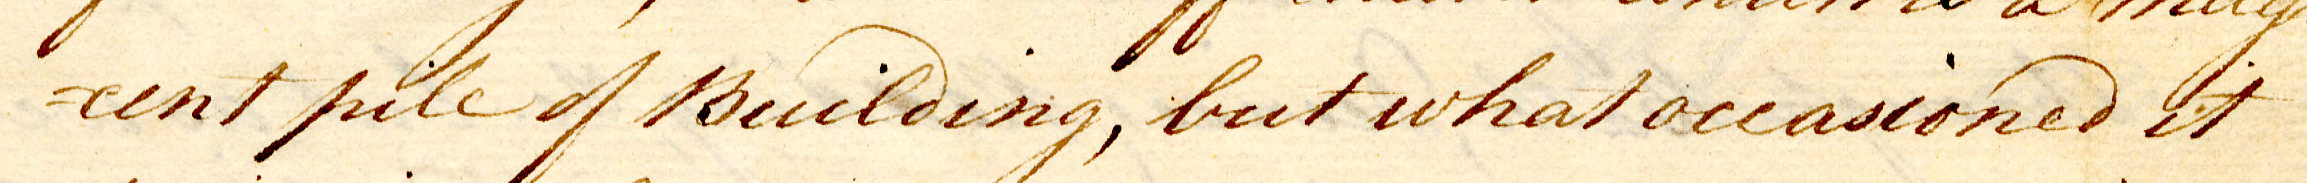-cent pile of Building, but what occasioned it
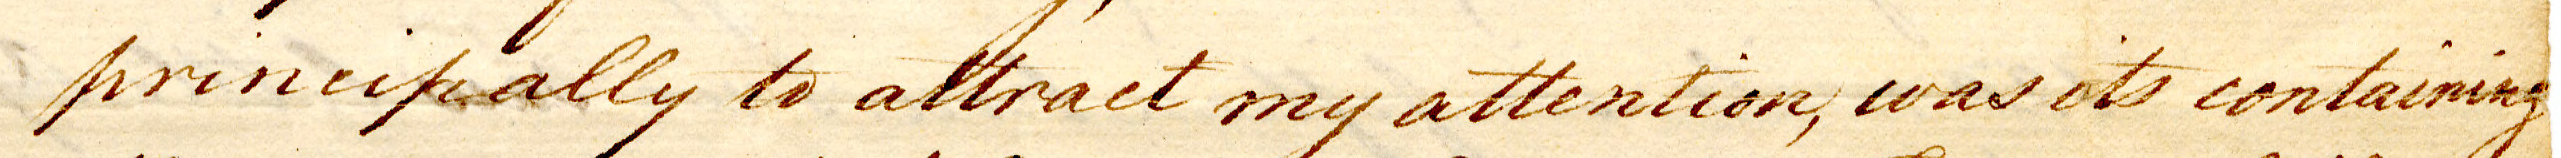principally to attract my attention, was its containing
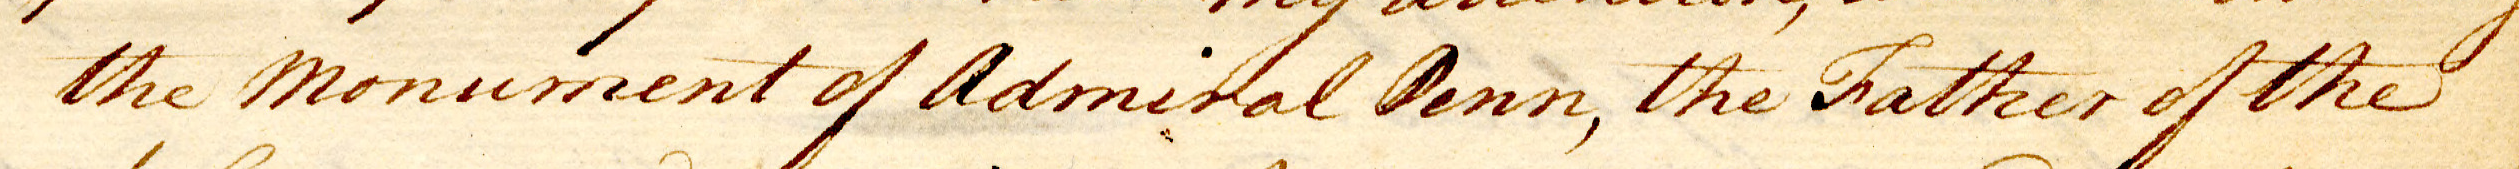the Monument of Admiral Penn, the Father of the
